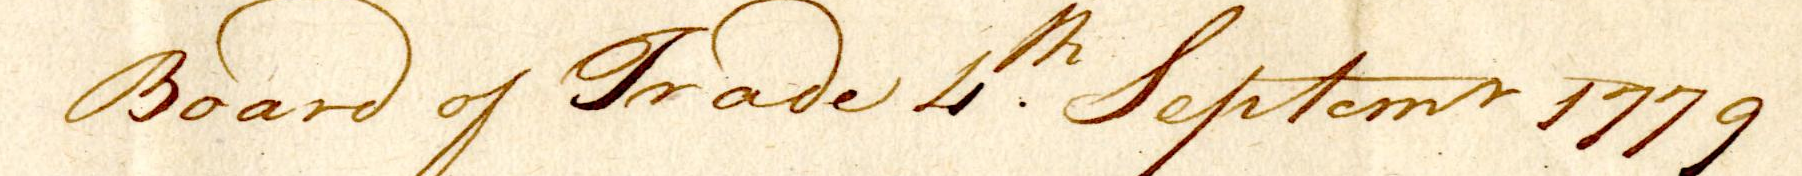Board of Trade 4^th. Septem^r 1779
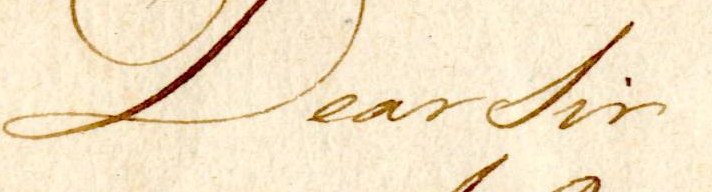Dear Sir
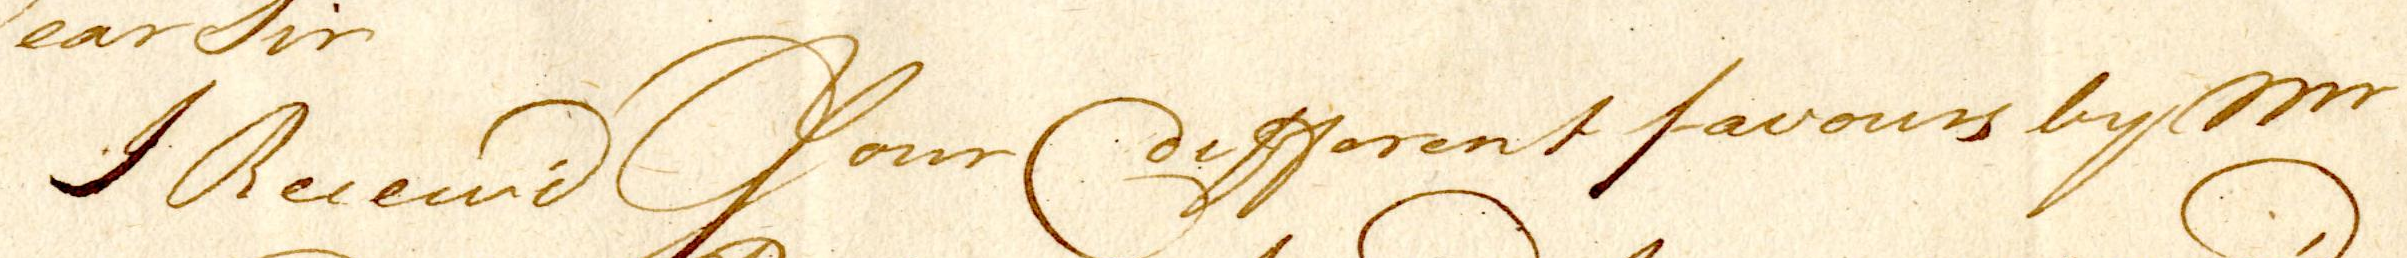I Receiv'd Your deffarent favors by M^r
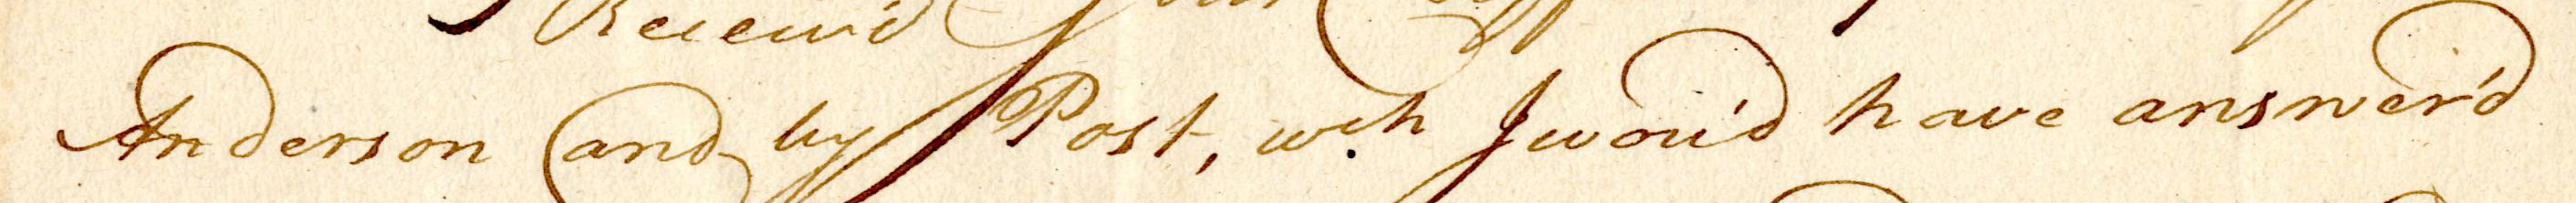Anderson and by Post with I wou'd have answer'd
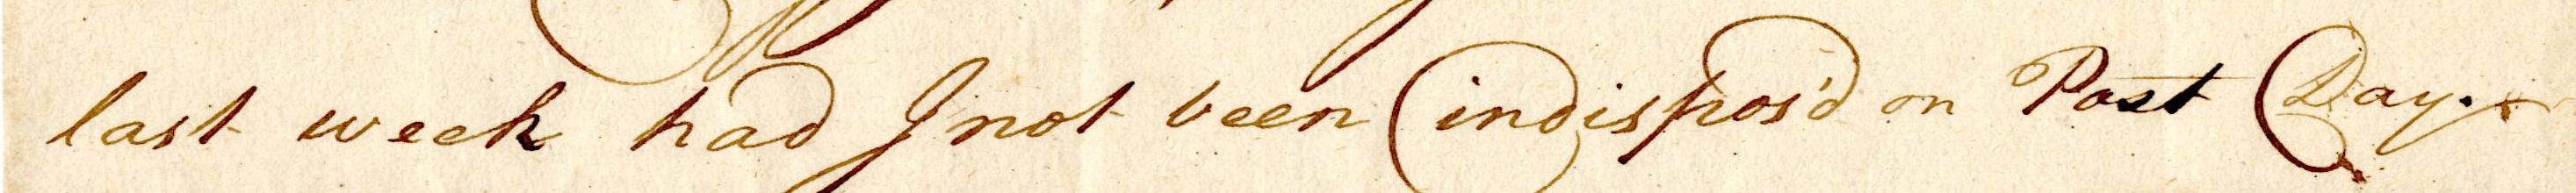last week had I not been indispos'd on Post Day.
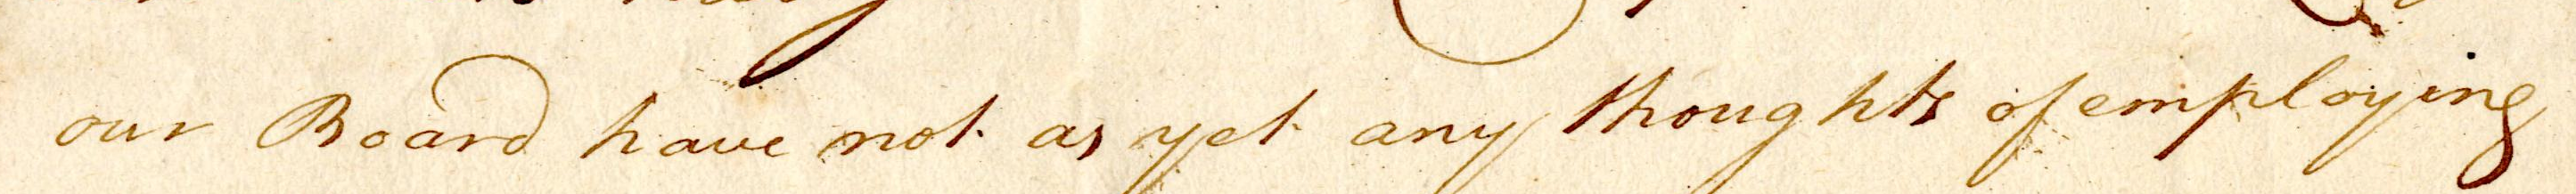our Board have not as yet any thoughts of employing
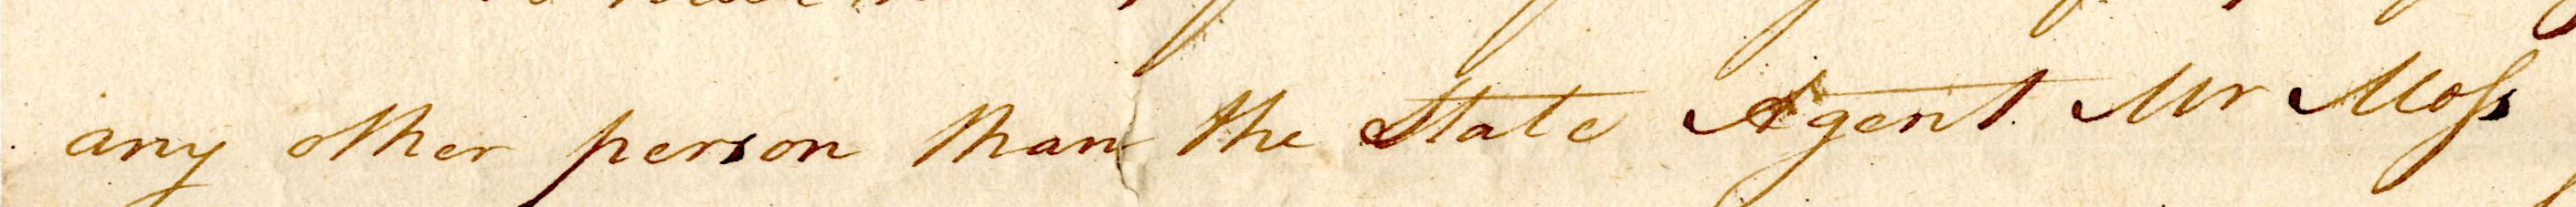any other person than the State Agent M^r Moss
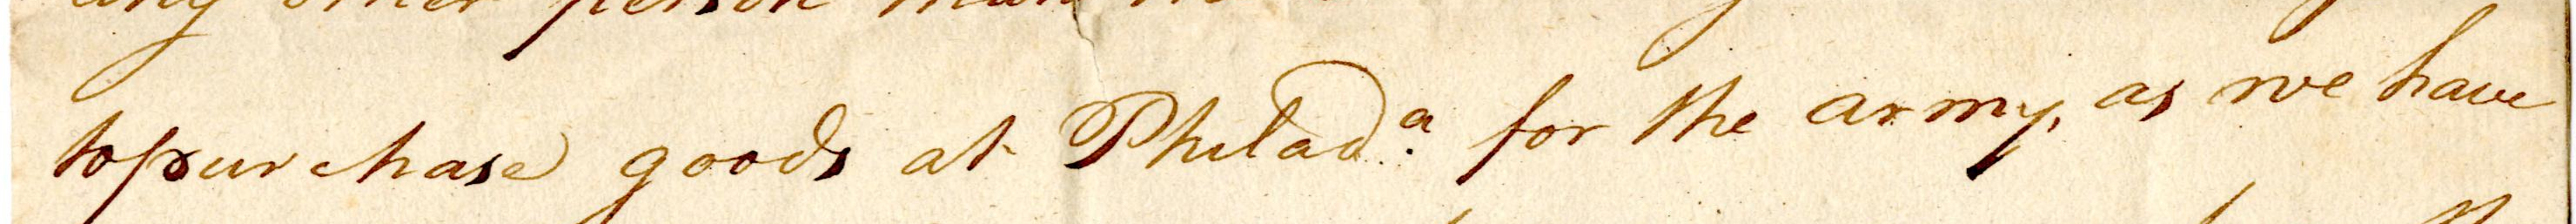to purchase goods at Philad^a. for the army, as we have
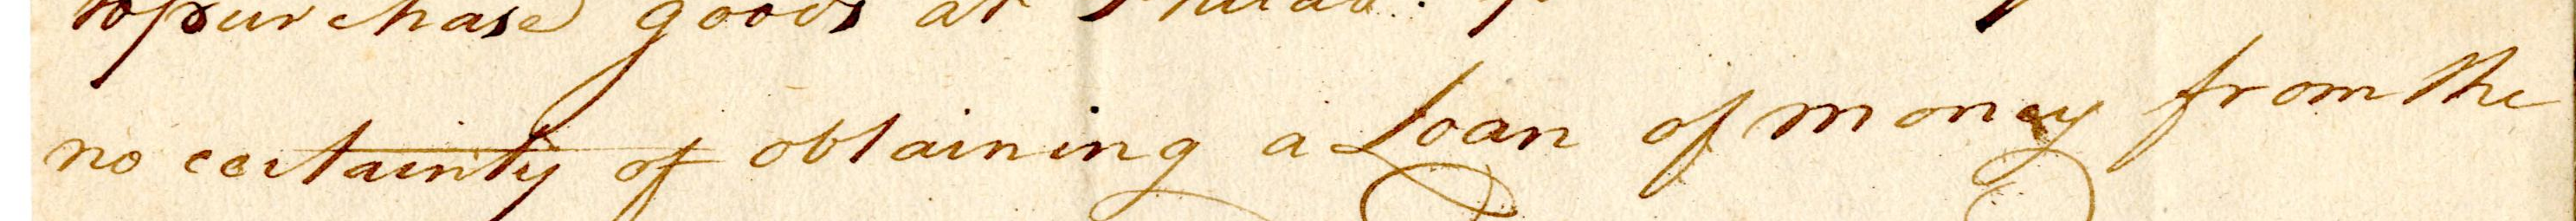no certainty of obtaining a Loan of money from the
